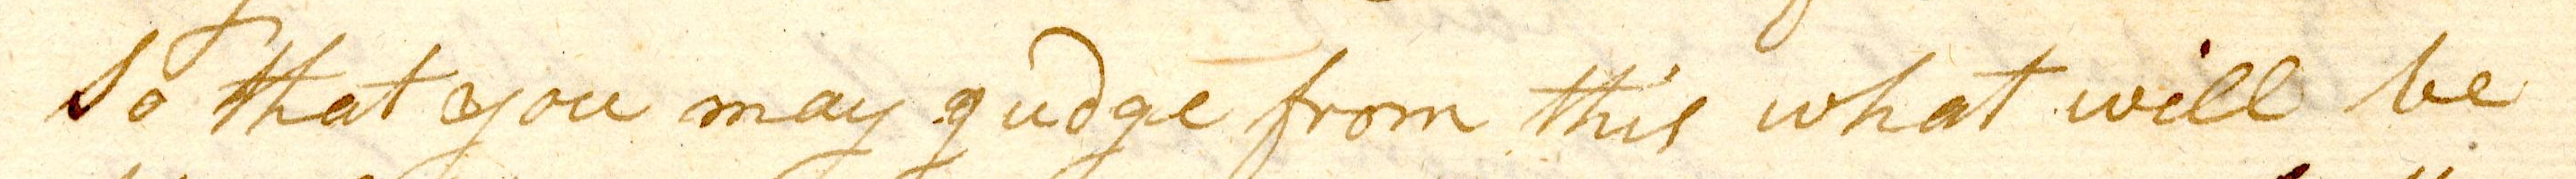So that you may judge from this what will be
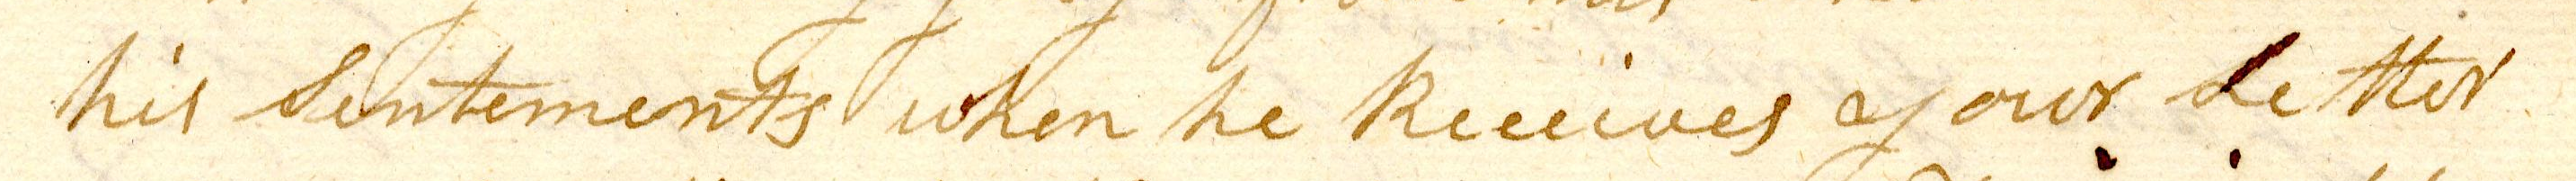his Sentements when he Receives your Letter
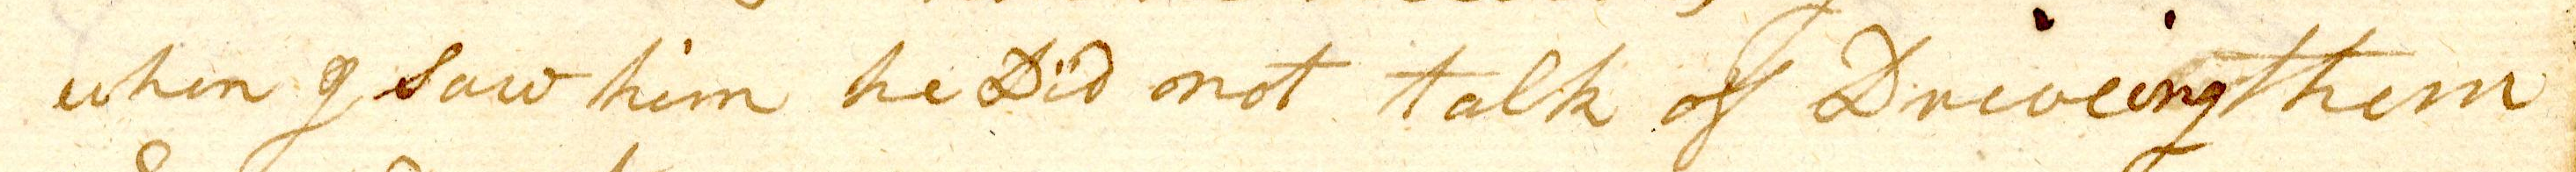when I saw him he Did not talk of Driveing them
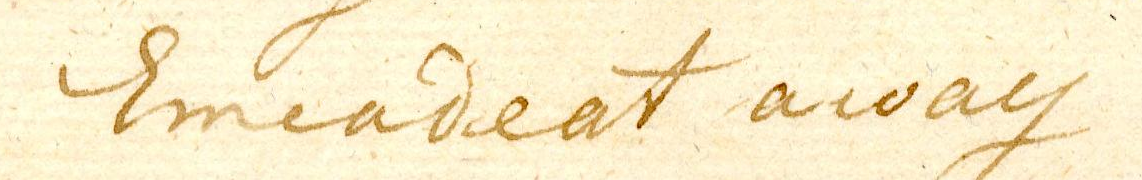Emeadeat away
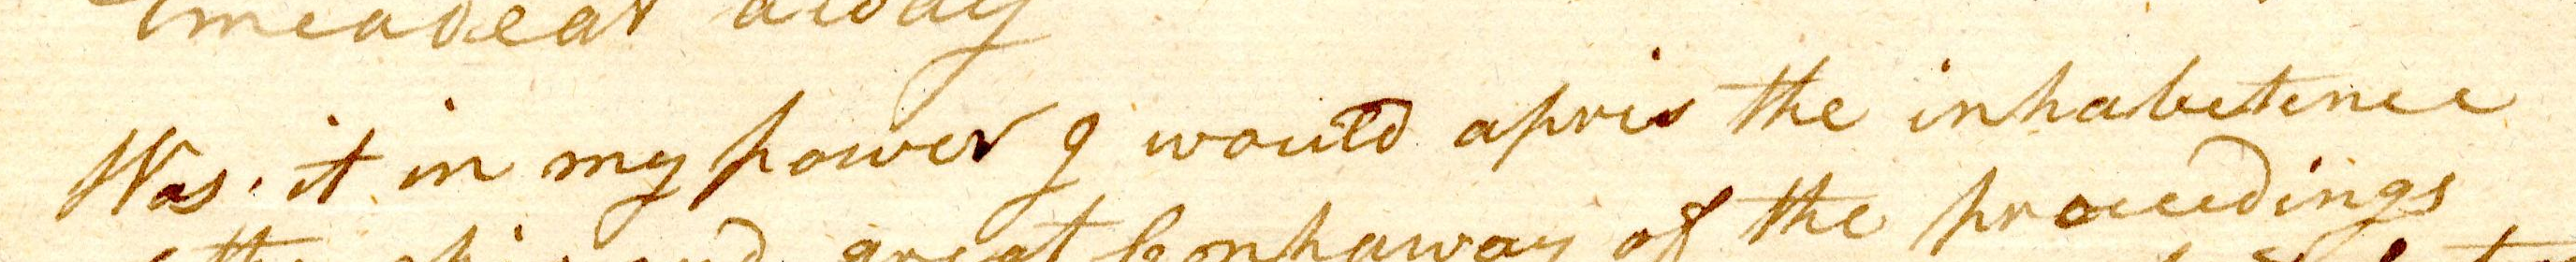Was it in my power I would apris the inhabetence
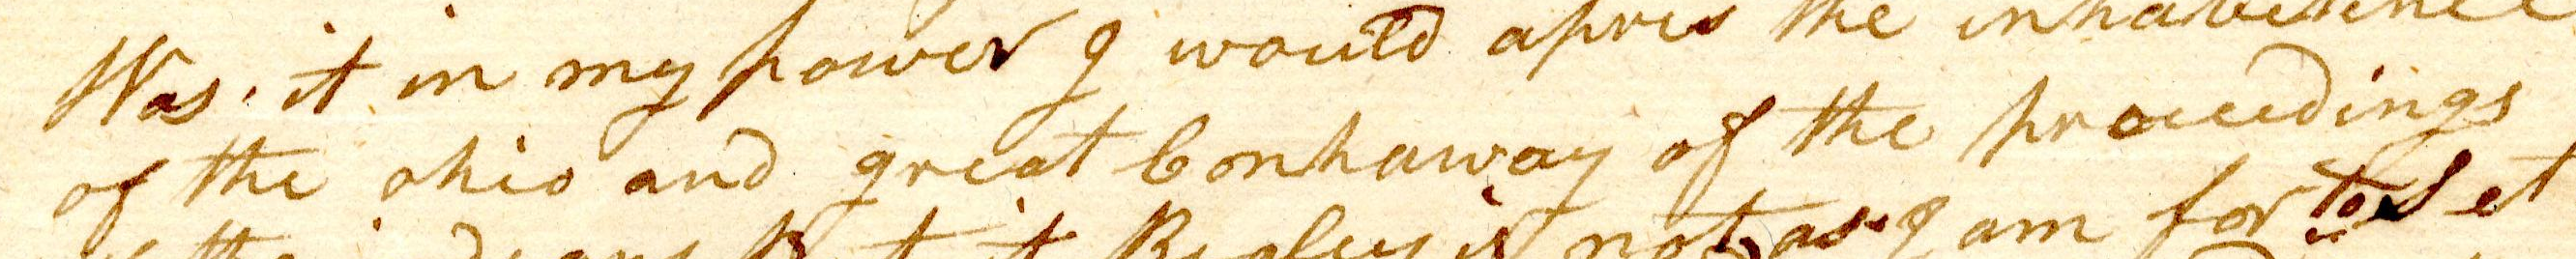of the Ohio and great Conhaway of the proceedings
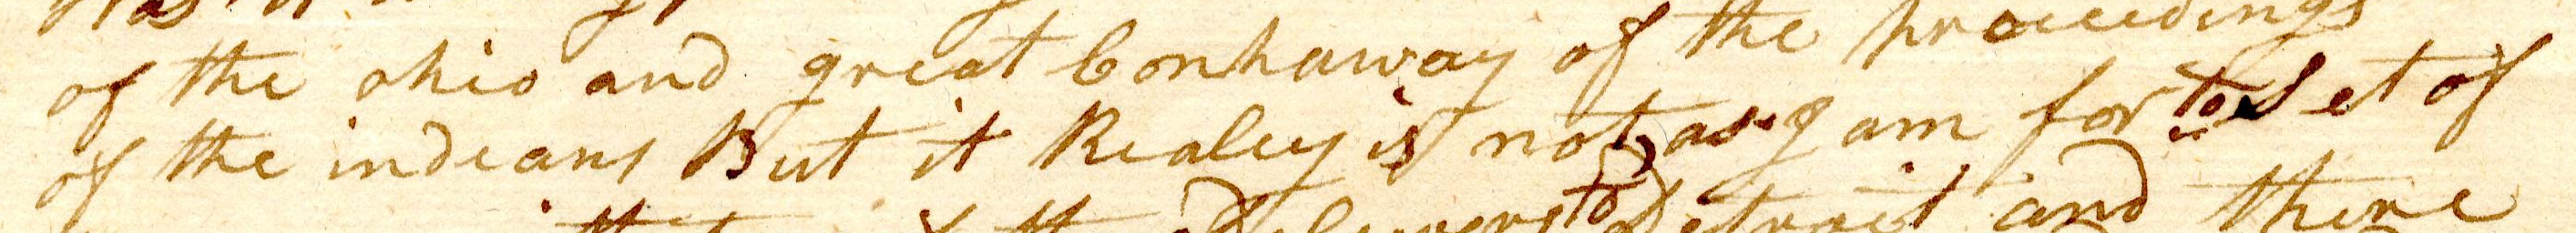of the indians But it Realey is not, as I am for to set of
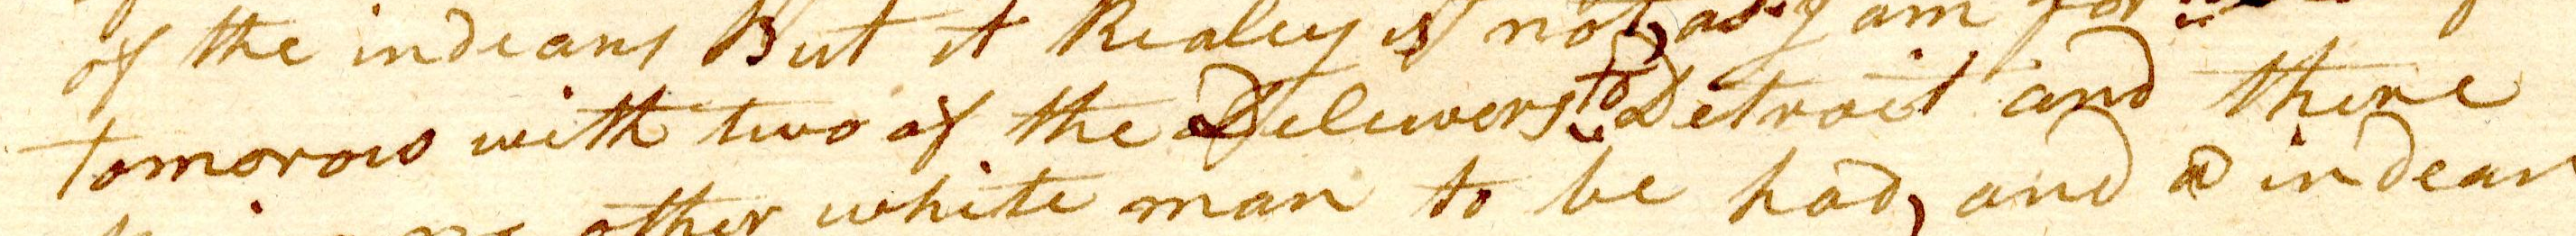tomorow with two of the Delewers to Detroit and there
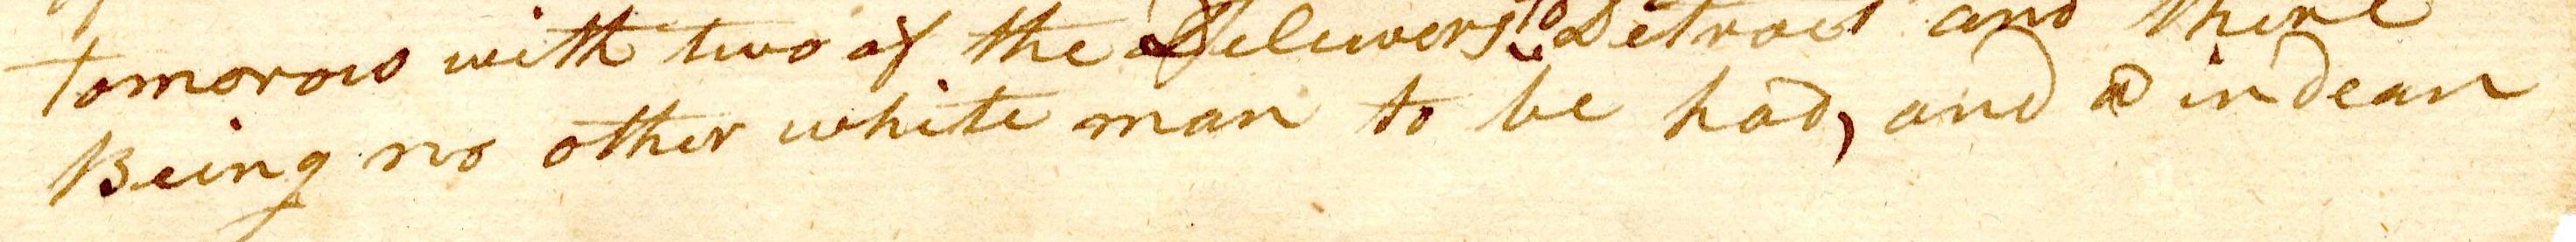Being no other white man to be had, and a indean
